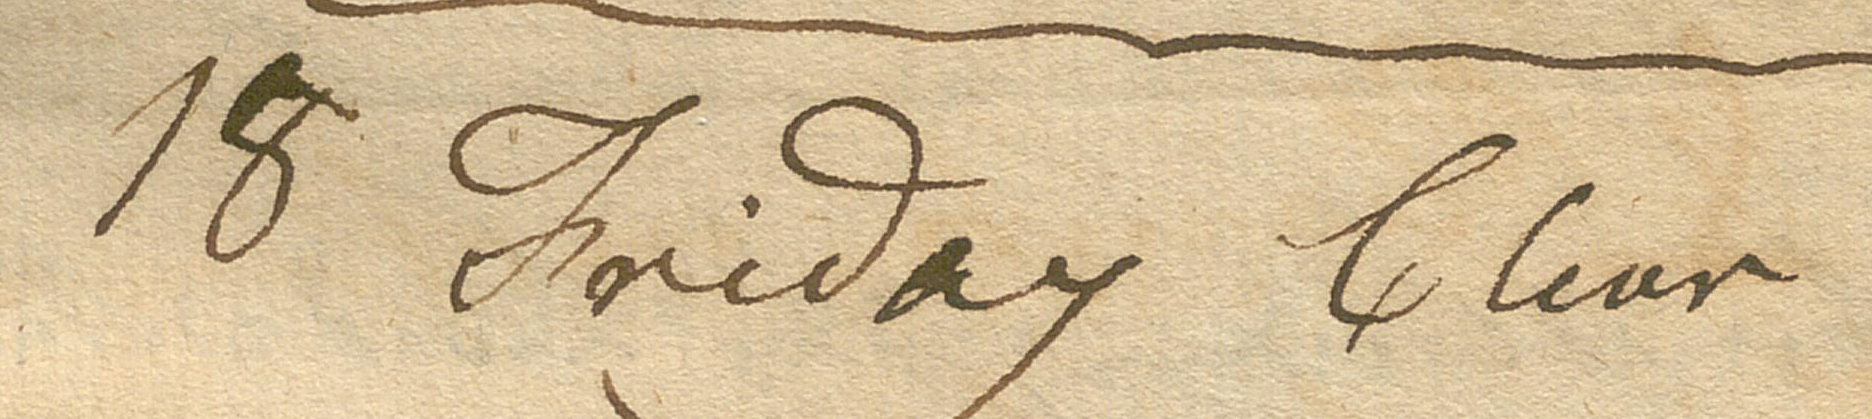18 Friday Clear
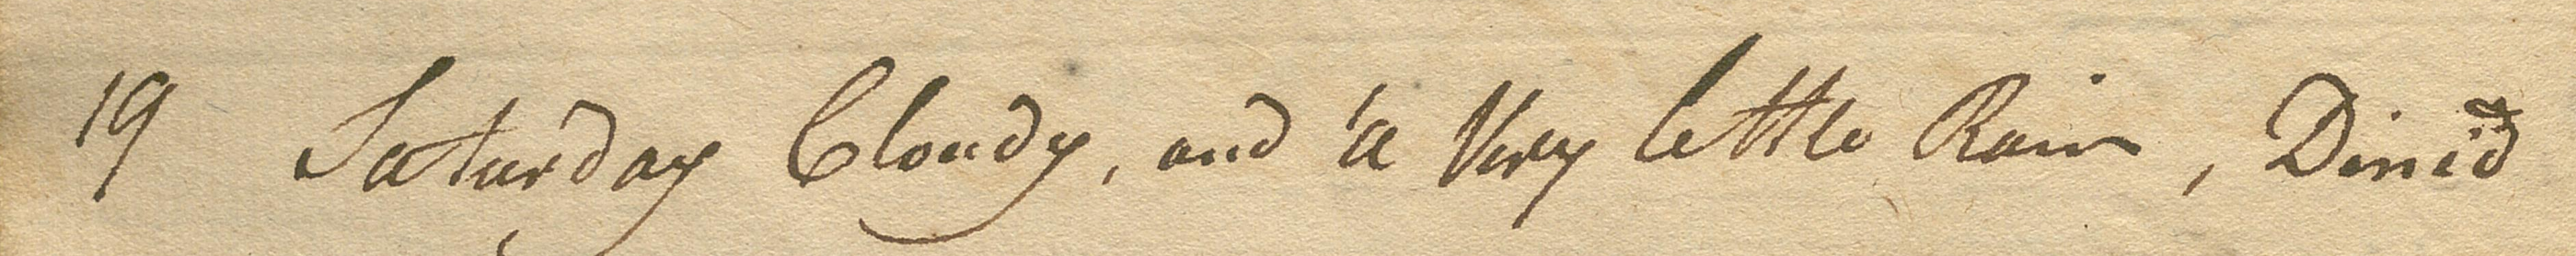19 Saturday Cloudy, and a Very little Rain, Dined
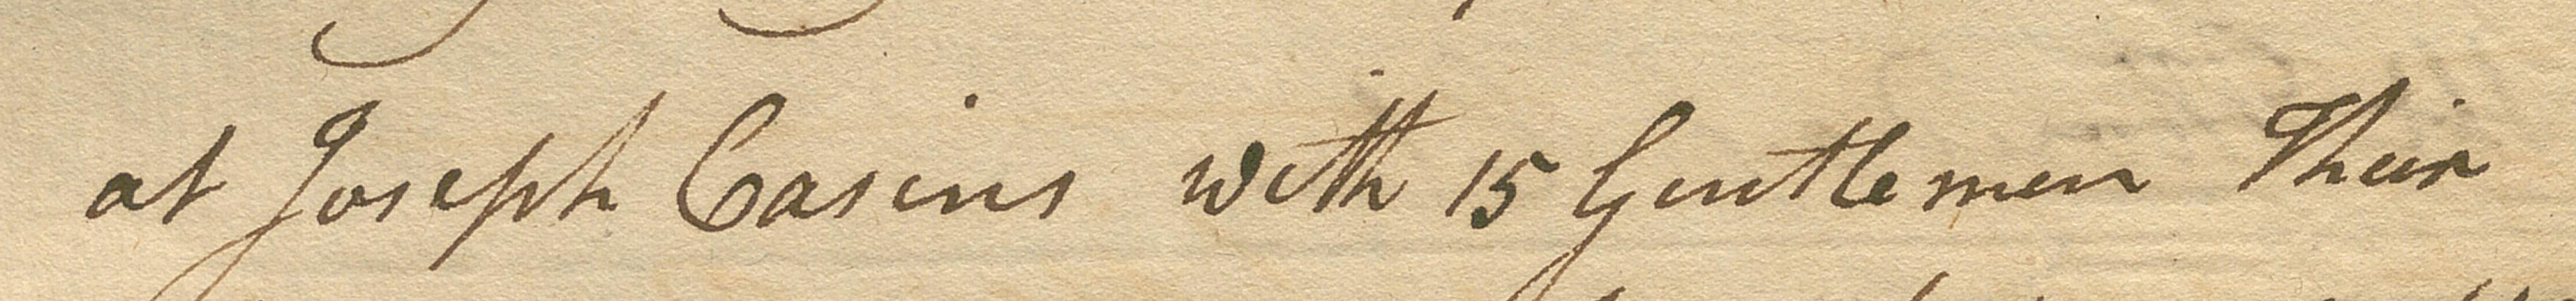at Joseph Casins with 15 Gentlemen Their
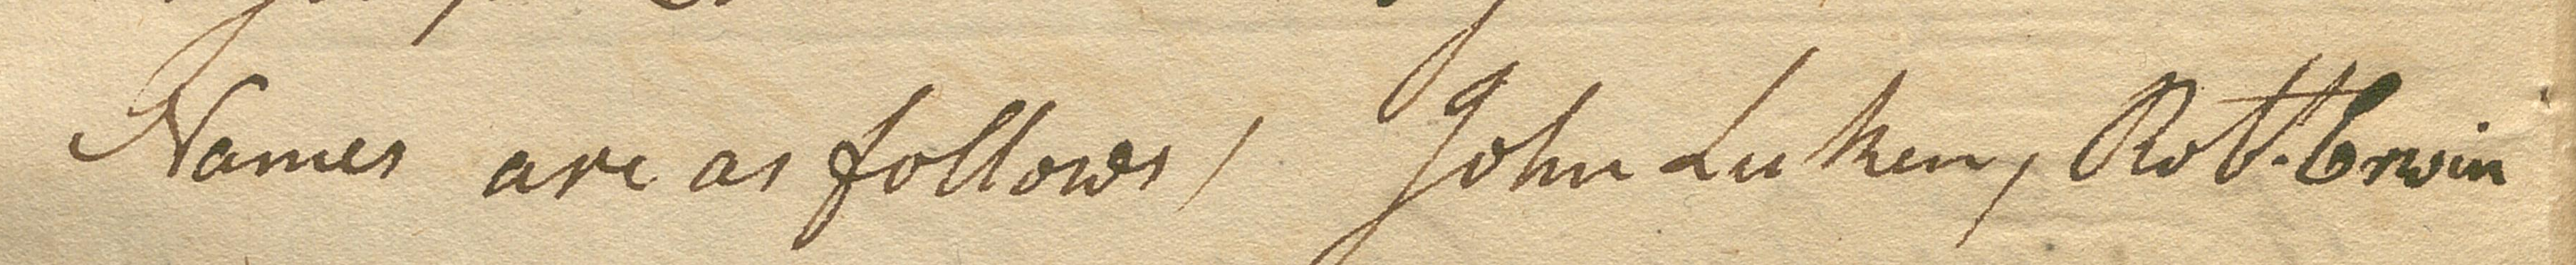Names are as follows, John Luken, Rob^t. Erwin
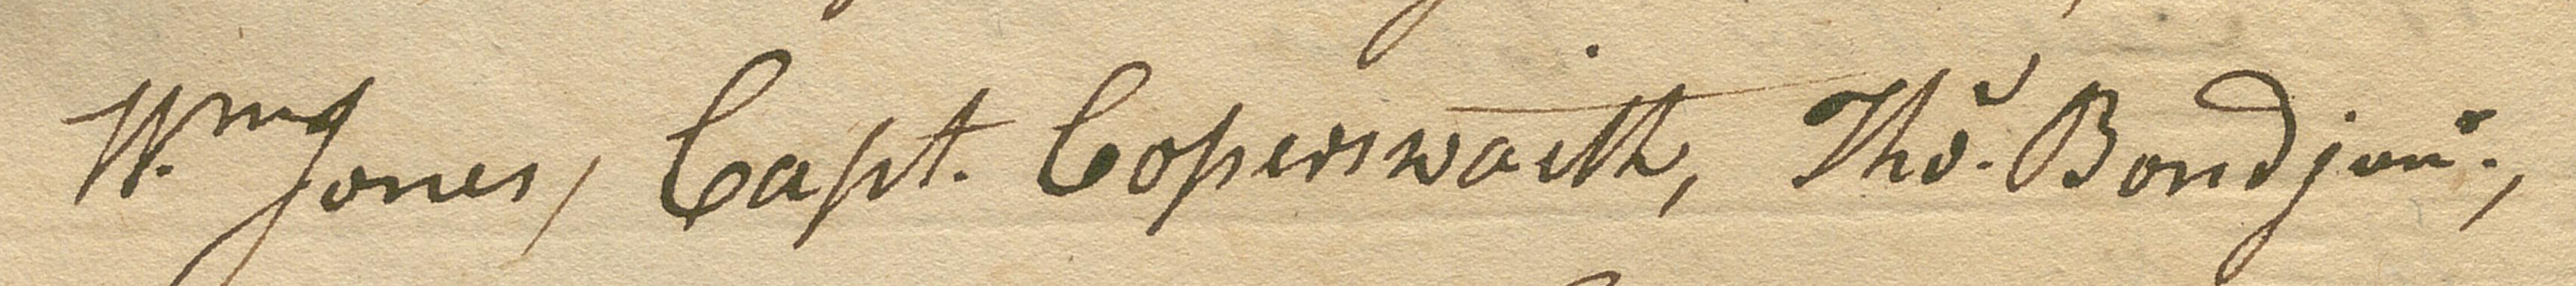W^m. Jones, Capt. Coperswaith, Tho^s. Bond jun^r.,
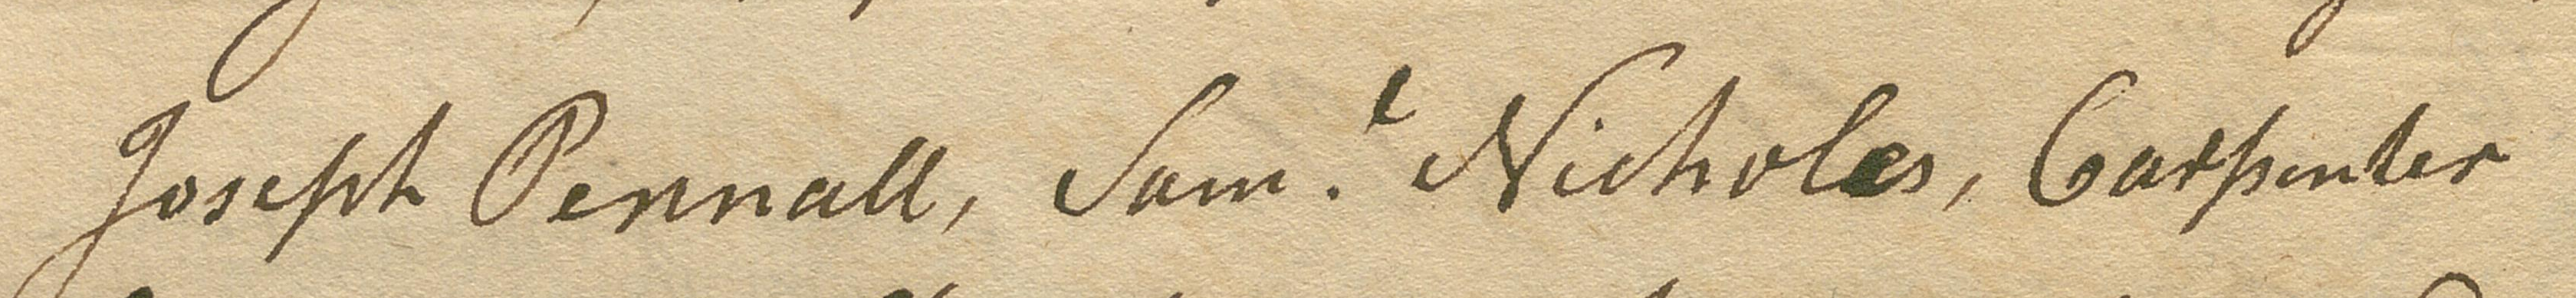Joseph Pennall, Sam^l. Nicholes, Carpenter
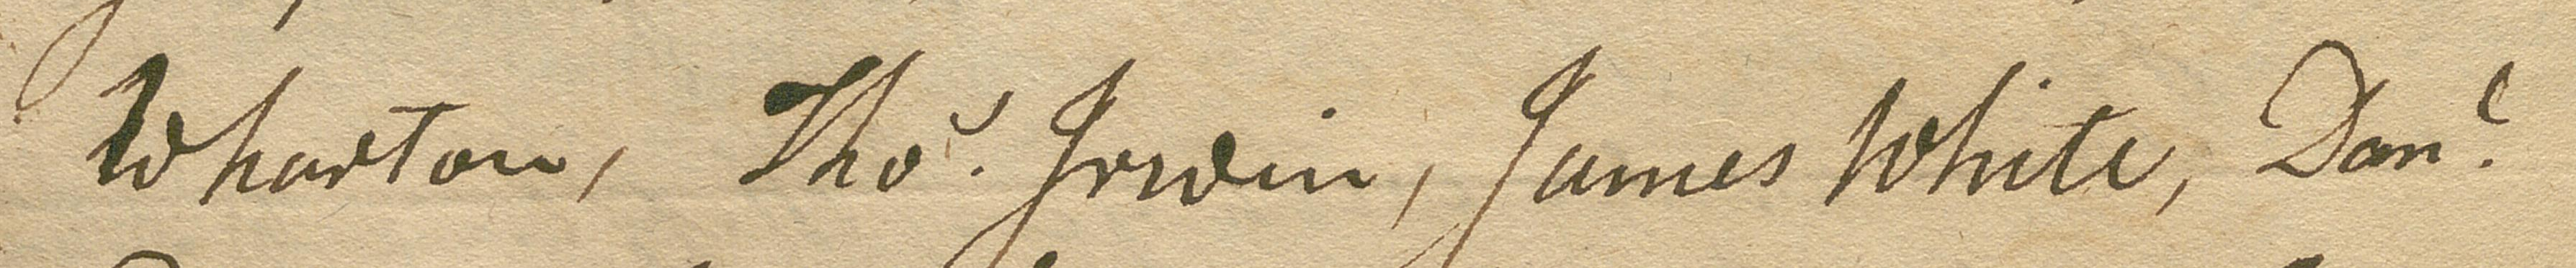Wharton, Tho^s. Irwin, James White, Dan^l.
